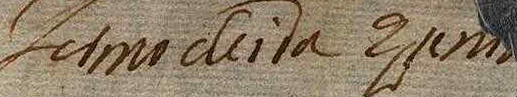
Termo de ida E peni
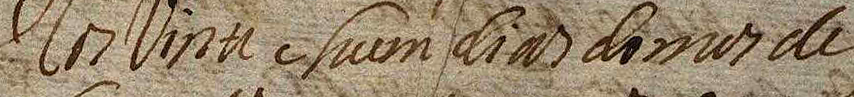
Aos Vinte e hum dias do mes de
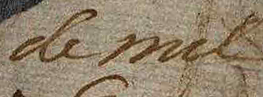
de mil
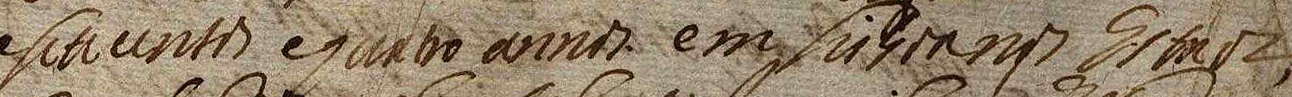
e setecentos e quatro annos. em Lisboa nos Estaoz,
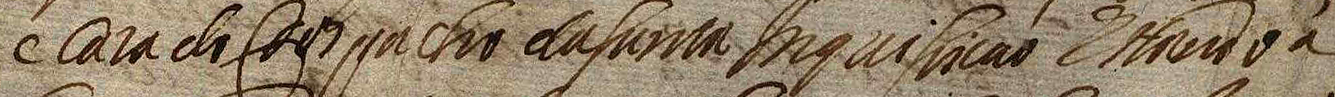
e caza do Despacho da santa Inquisiçao Estando a
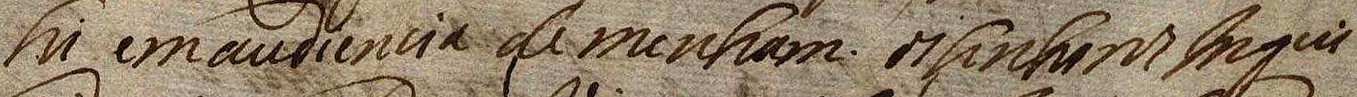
hi em audiencia de menham. os senhores Inqui
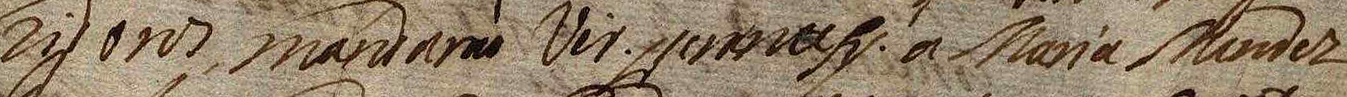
zidores, mandaraõ Vir. perante sy. a Maria Mendez
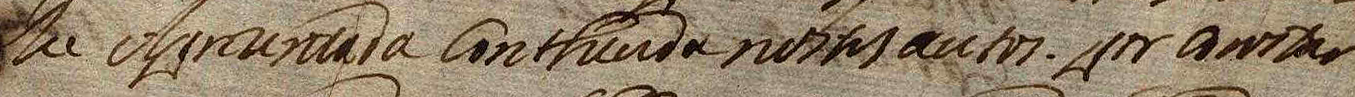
Ree Aprezentada Contheuda nestes autos. por constar
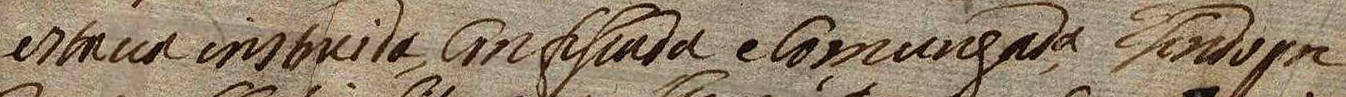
estaua instruida, Confessada e Comungada, E sendo pre
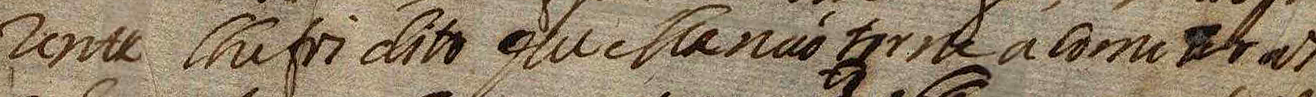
zente lhe foi dito que ella naõ torne a cometer as
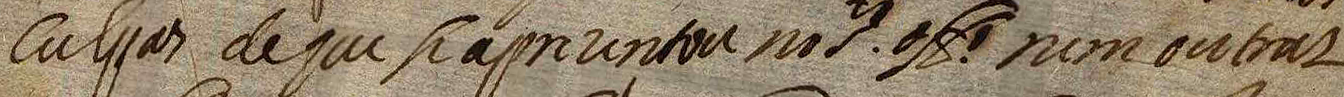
Culpas de que se aprezentou no s.to off.o nem outraz
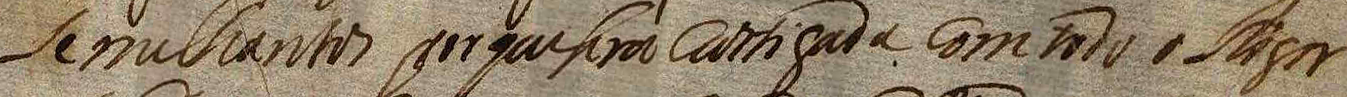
semelhantes porque será Castigada Com todo o Rigor
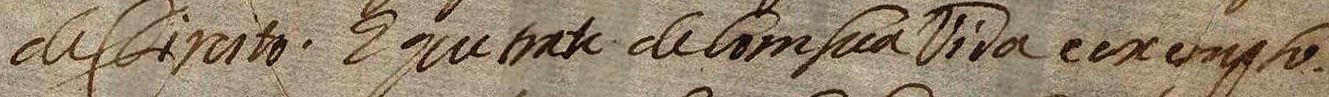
de Direito. E que trate de Com sua Vida e exemplo
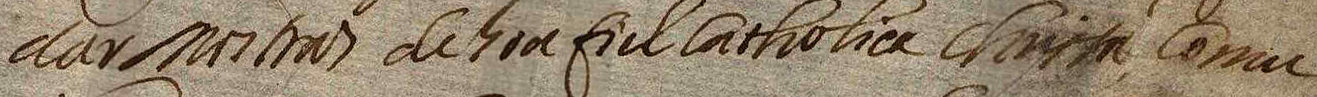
dar mostras de boa fiel Catholica Christā, Comu
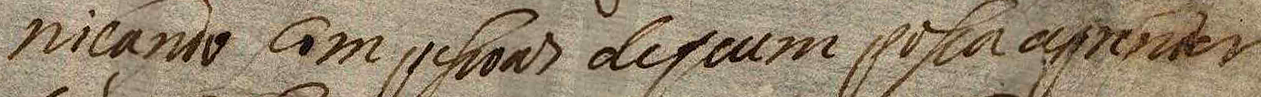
nicando com pessoas de quem possa aprender
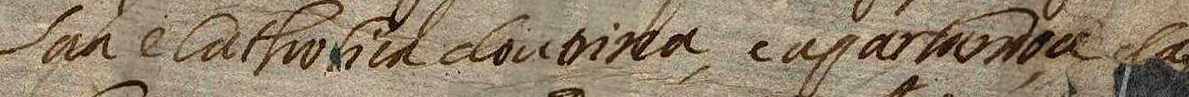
san e Catholica doutrina, e apartandoce das
